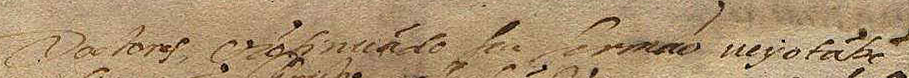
Doctores, & ēsinuādo seu sermaõ ueyo tābē
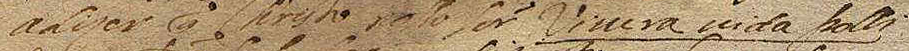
a dizer q̄ Christo nosso sor̄ Viuera uida polli
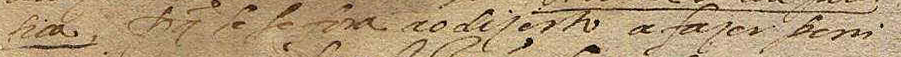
tica p̄q̄ se se fora ao dezerto a fazer peni
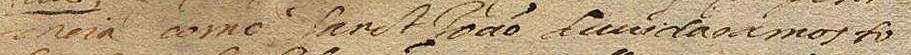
tencia como sanct Joaõ duvidaramos to
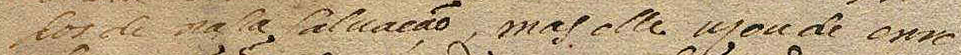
dos de nossa saluaçaõ, mas elle uzou de erra
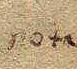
nota
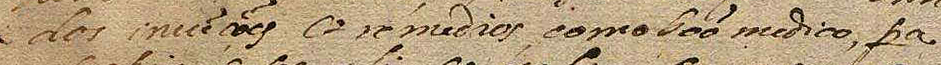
das inuēções & remedios como boō medico, ꝑa
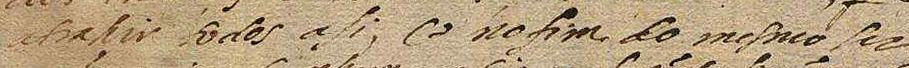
atrahir todos a si, & no fim do mesmo ser
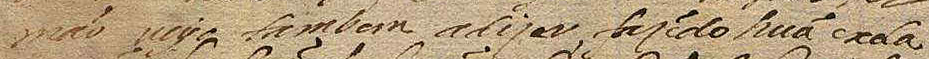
maõ ueyo tambem a dizer, fazēdo huā excla
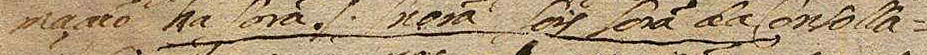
maçaõ ha sorā ./. Snorā sois sorā da Consolla
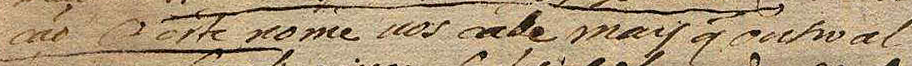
çaõ & este nome uos cabe mais q̄ outro al
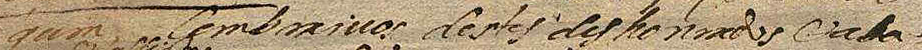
gum lembraiuos destes deshonrados & aba
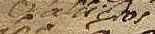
& aflictos
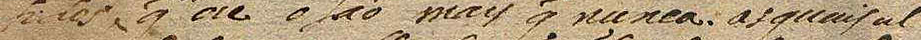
tidos q̄ oie o saõ mais q̄ nunca as quais ul
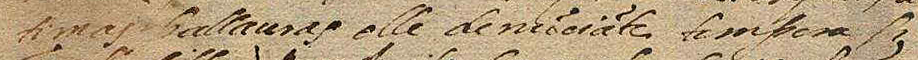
timas pallauras elle denūciāte tem pera si
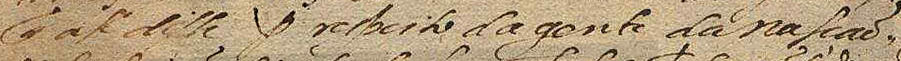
q̄ a si disse p̄ respeito da gente da nasçaõ,
